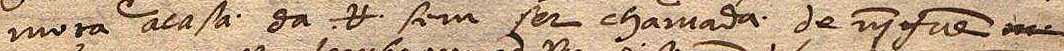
moça a casa. da .R. sem ser chamada. de n̄jgūe _
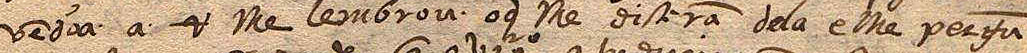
vēdoa. a. R lhe lembrou. o q̄ lhe diser̄a dela e lhe perḡu
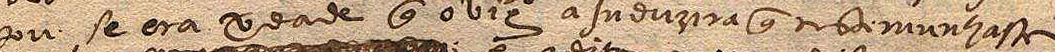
tou. se era ꝟdade q̄ o vigro a Jnduzira q̄ testemunhasse
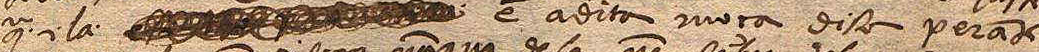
ꝯ̄. ela. _ e a dita moça dise perāte
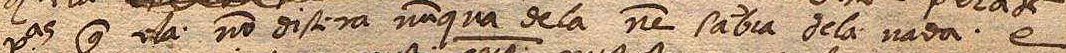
p.as q̄ ela. n̄o disera n̄uqua dela n̄e sabia dela. nada. e
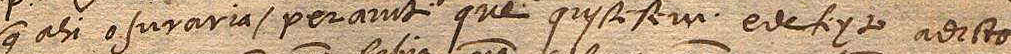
q̄ asi o Juraria / peramte q̄ue qujsesem. e de feyto a dicta
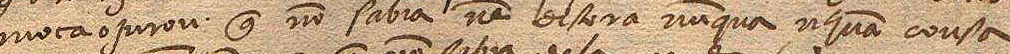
moca o jurou. q̄ n̄o sabia n̄e disera n̄uqua nhūa cousa
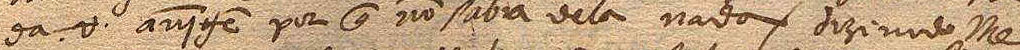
da .R. a n̄jgē porq̄ n̄o sabia dela nada / dizemdo lhe
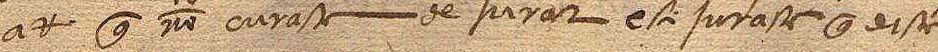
a R. q̄ n̄o curasse de Jurar e se Jurase q̄ dise
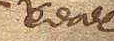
ꝟdade
